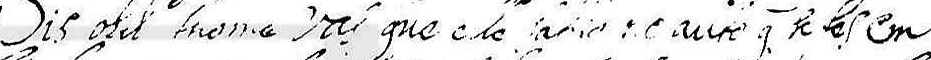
Dis o l.do thome vas que ele sahio no auto q̄ se fes em
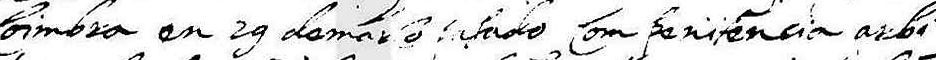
Coimbra en 29 de marso pasado com penitencia arbi
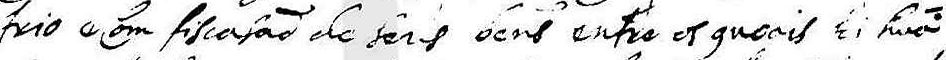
trio e Comfiscasaõ de seus bens entre os quoais __ huā
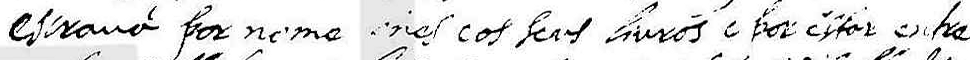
escrava por nome ines e os seus livros e por estar entre
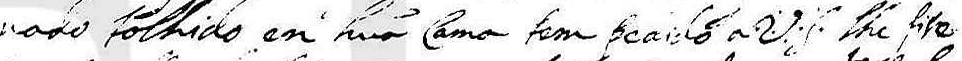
vado tolhido en huã cama tem pedido a V.S. lhe fise
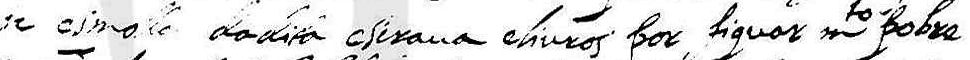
se esmolla da dita escrava e livros por fiquar mto pobre
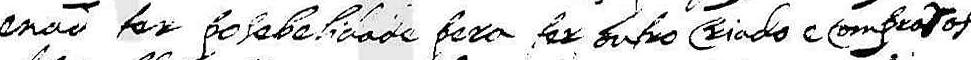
e não ter posebelidade pera ter outro criado e comprar os
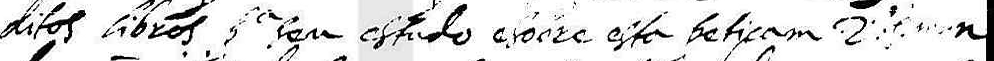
ditos libros p.a seu estudo e sobre esta petiçam V.S. man
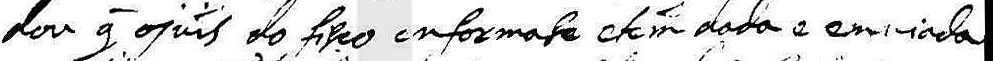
dou que o juis do fisco enformase e tem dada e emviada
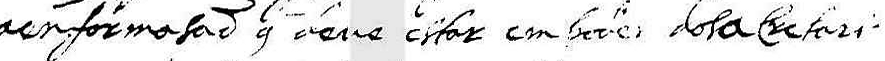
a enformasão que deve estar em poder do sacretario.
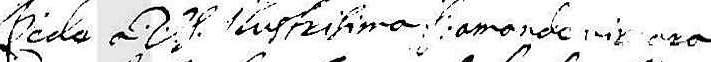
Pede a V.S. Ilustrisima _ a mande vir para
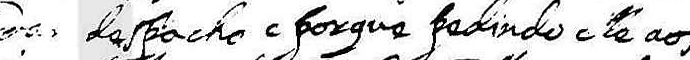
dar despacho e porque pedindo elle aos
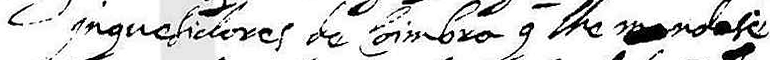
jnquesidores de Coimbra q̄ lhe mandase
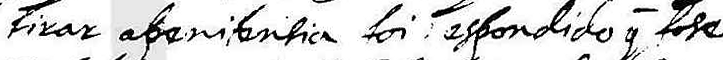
tirar a penitensia foi respondido que fose
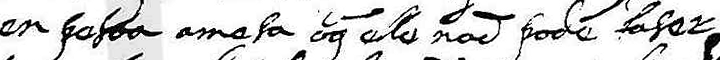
en pessoa a mesa o que elle naõ pode faser
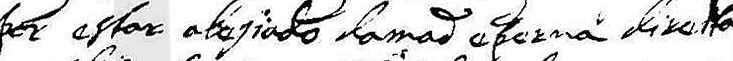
por estar aleijado da mão e perna direitta
